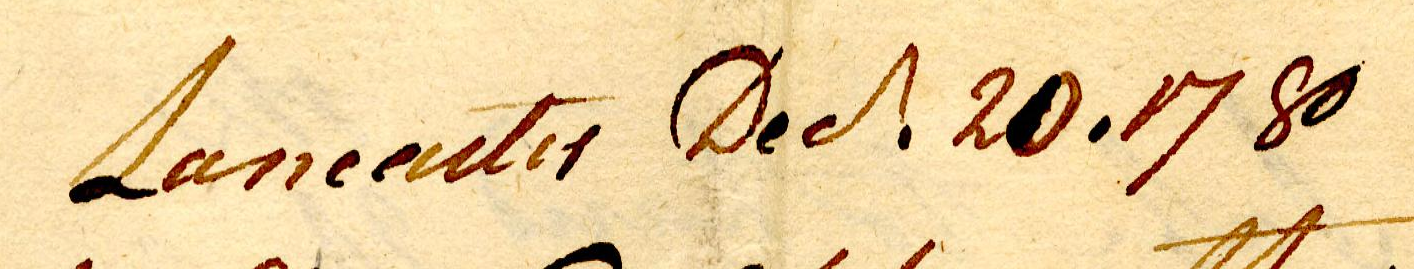Lancaster Dec^r 20. 1780
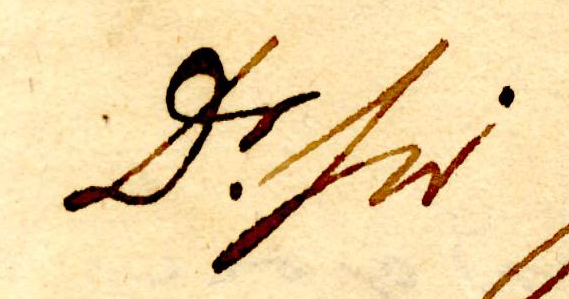D^r. Sir
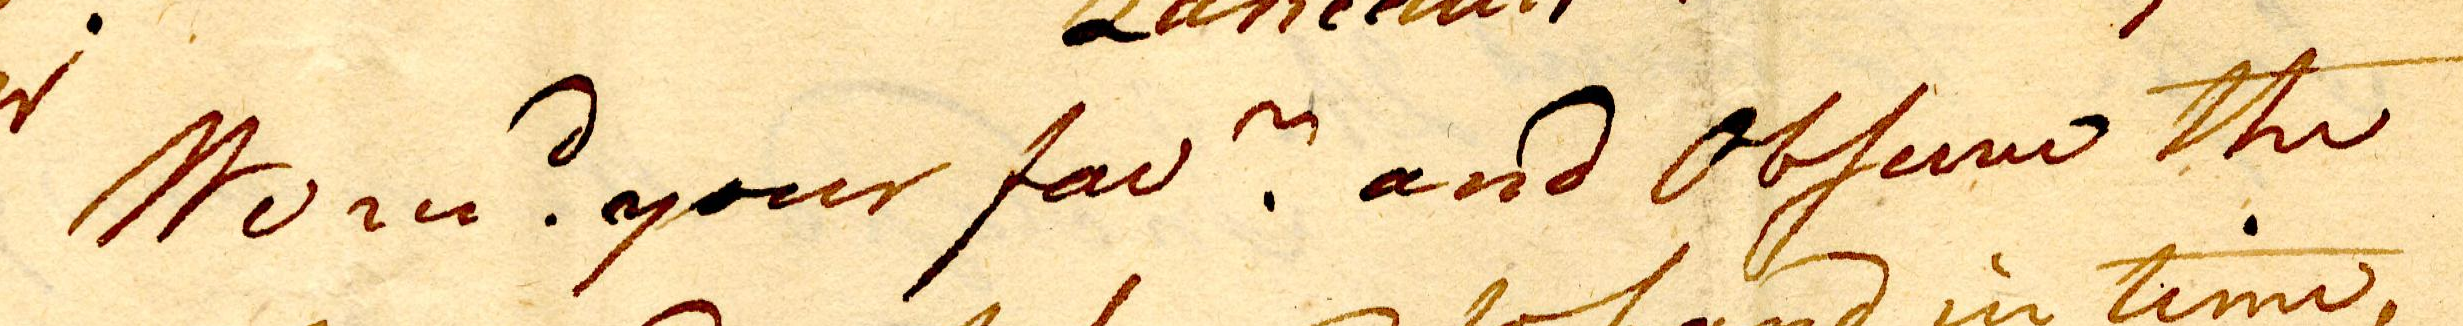We rec^d. your fav^r. and Observe the
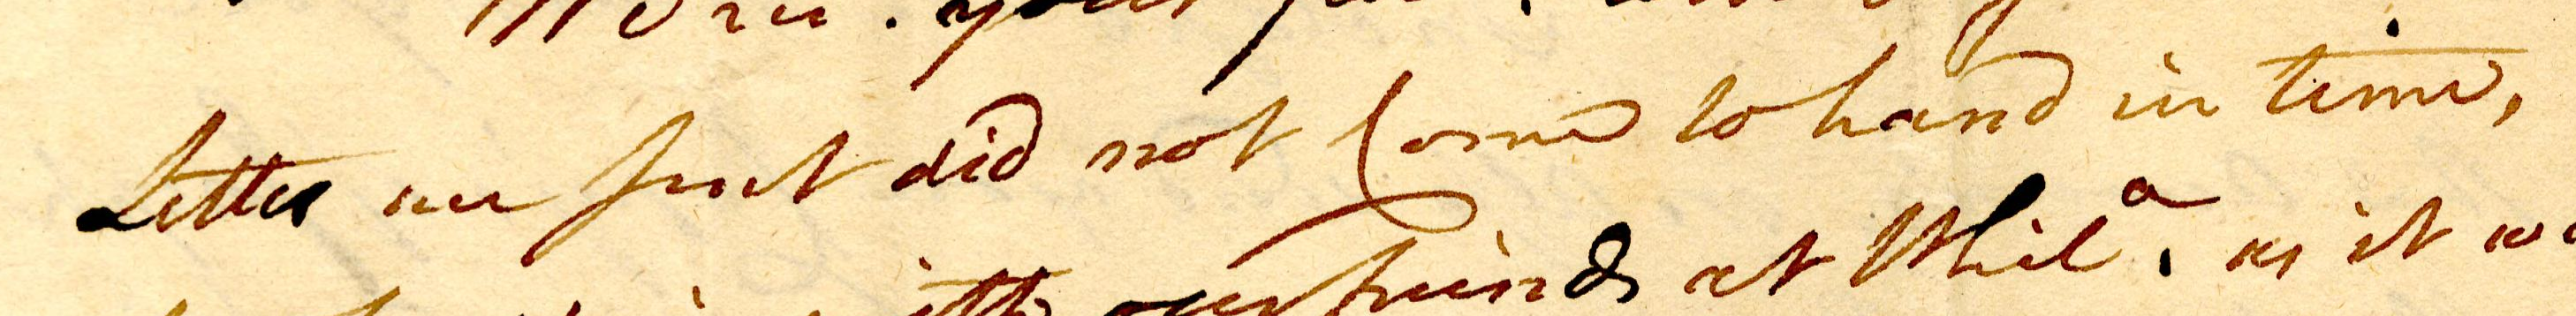Letter we sent did not Come to hand in time,
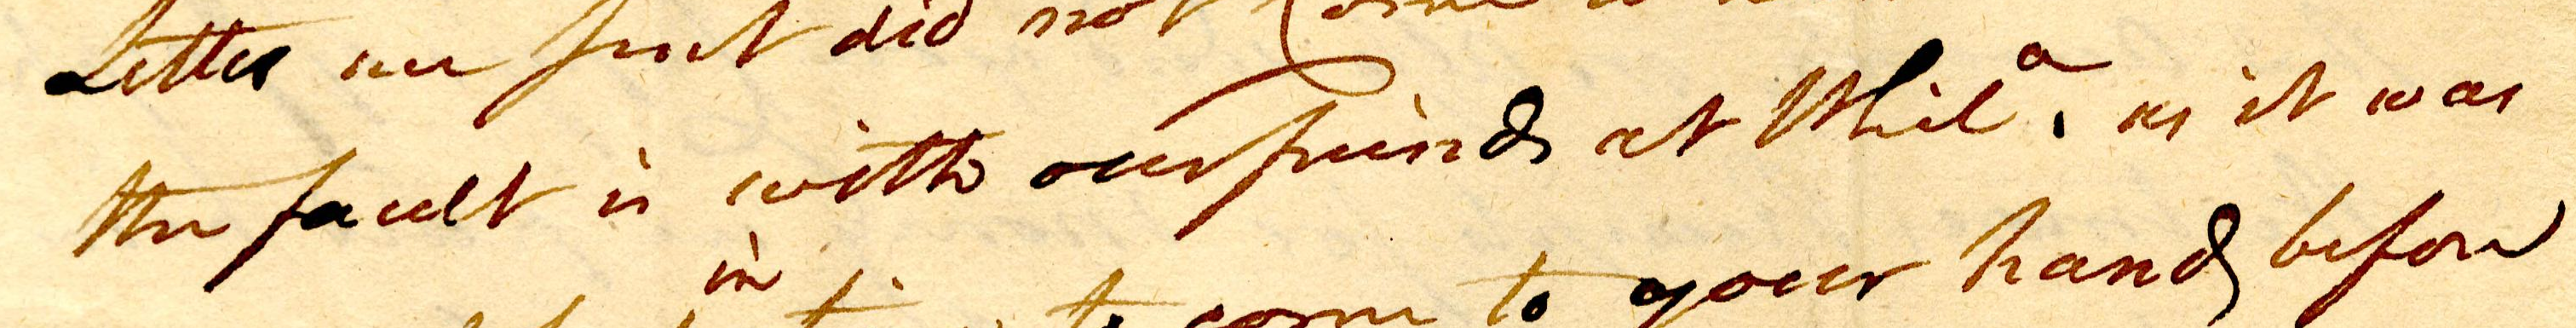the fault is with our friends at Phil^a. as it was
